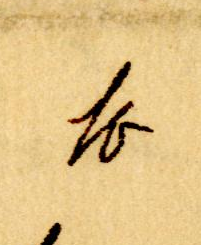To
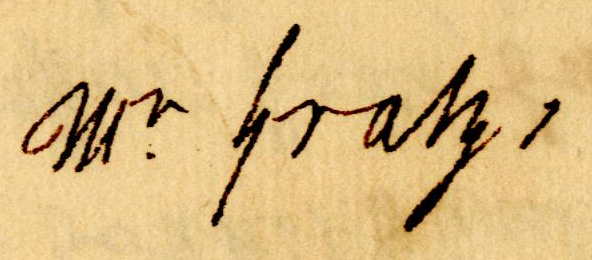M^r. Gratz
